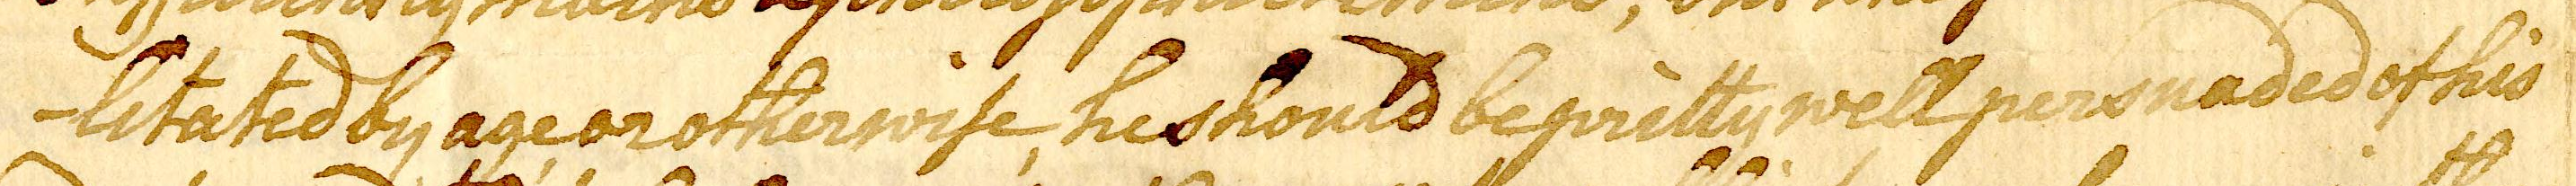-litated by age or otherwise, he should be pritty well persuaded of his
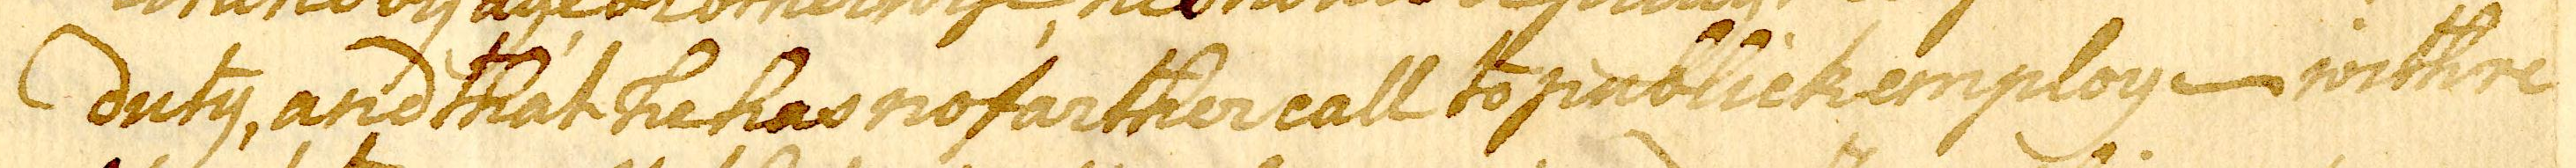duty, and that he has no farther call to publick employ- with re
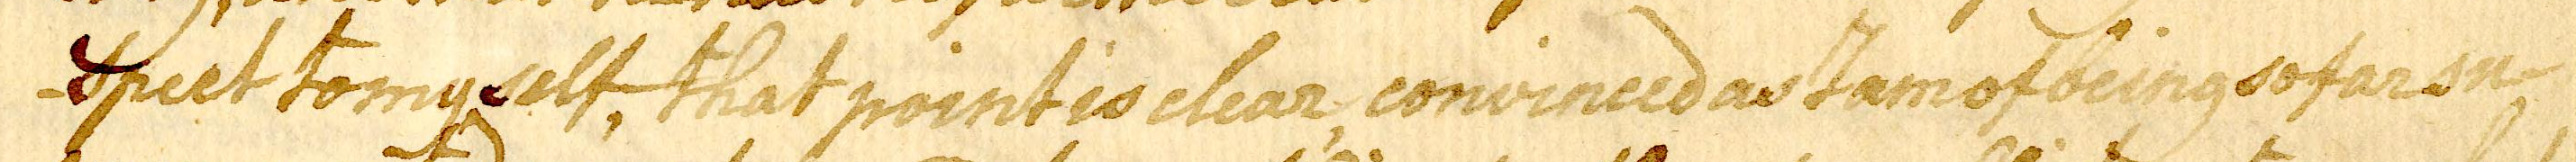-spect to myself, that point is clear, convinced as I am of being so far su-
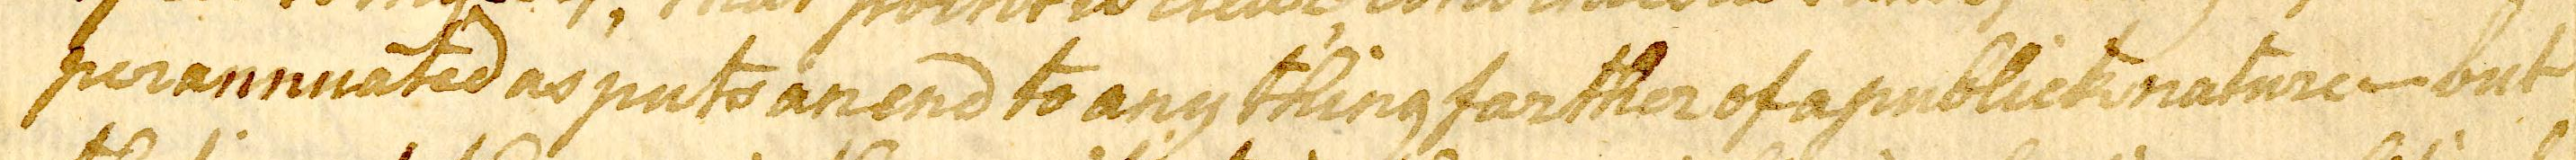perannuated as puts an end to any thing farther of a publick nature- but
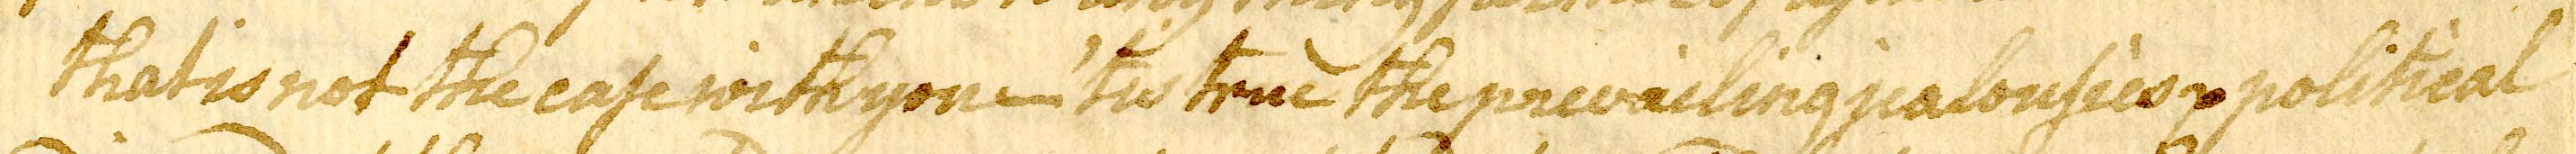that is not the cafe with you- 'tis true the prevailing jealousies & political
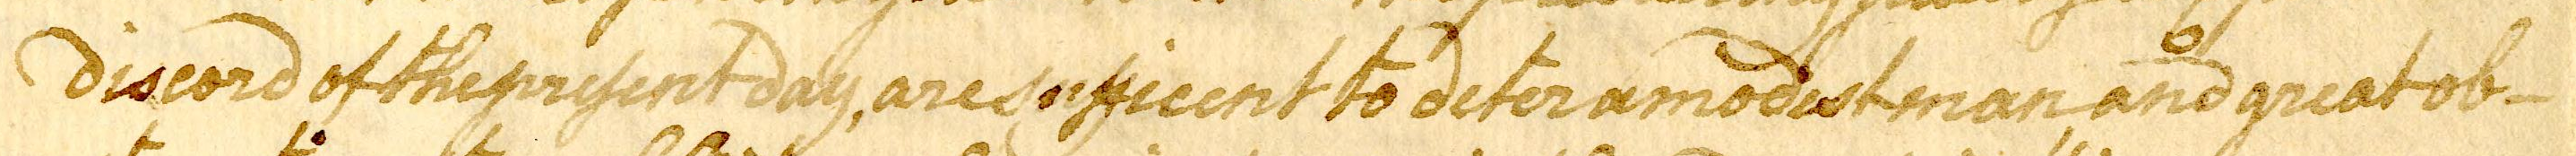discord of the present day, are sufficent to deter a modest man, and great ob-
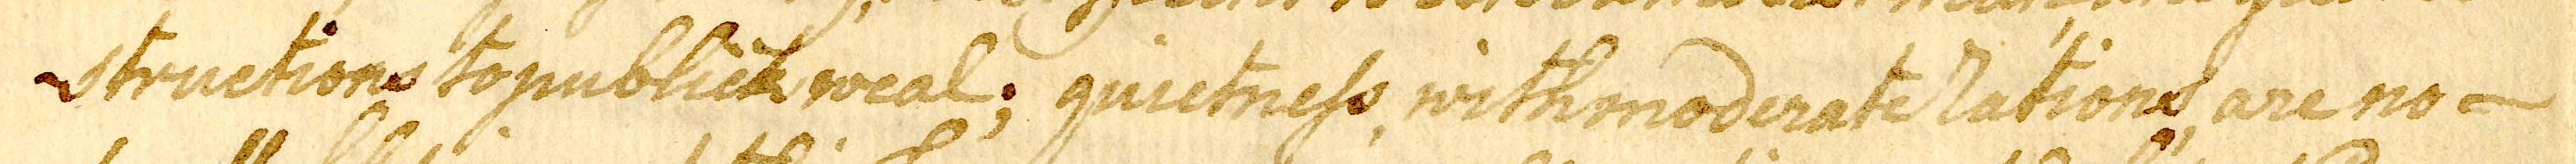structions to publick weal; quietness, with moderate Nations are no-
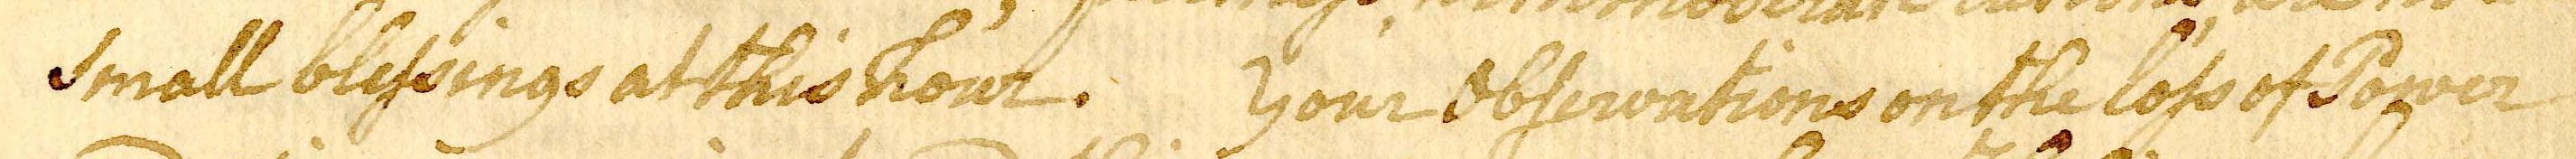Small blessings at this hour. Your Observations on the loss of Power
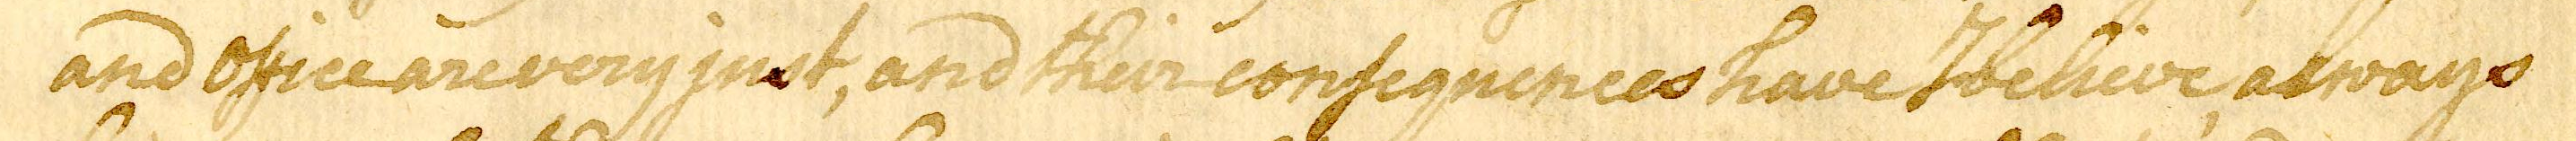and office are very just, and their consequences have I believe always
